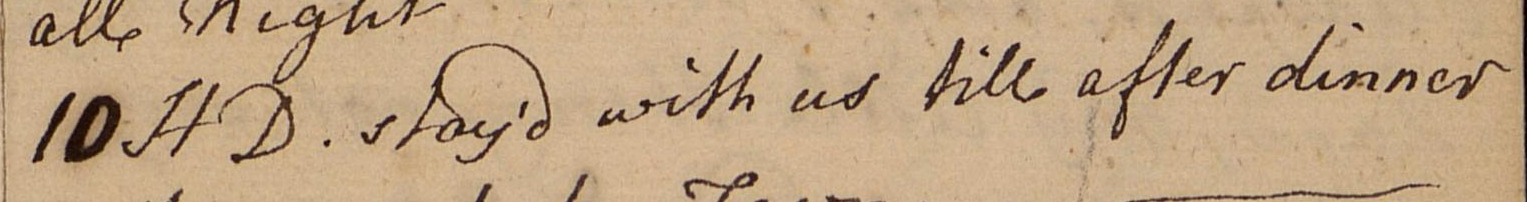10 H D. stay'd with us till after dinner
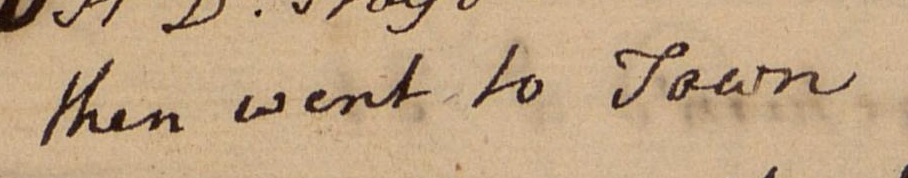then went to Town
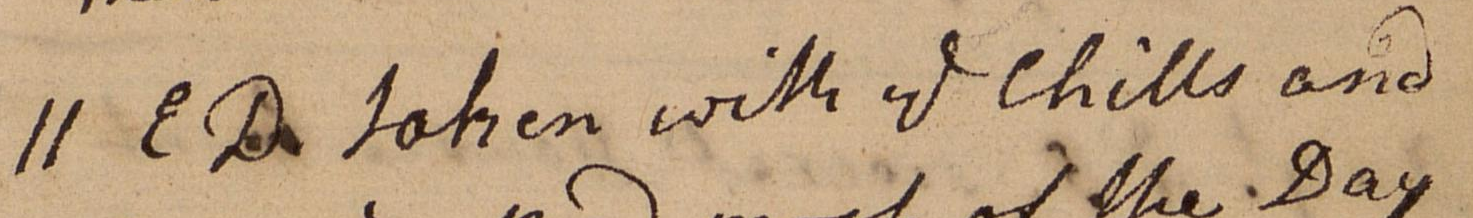11 E D taken with y^e Chills and
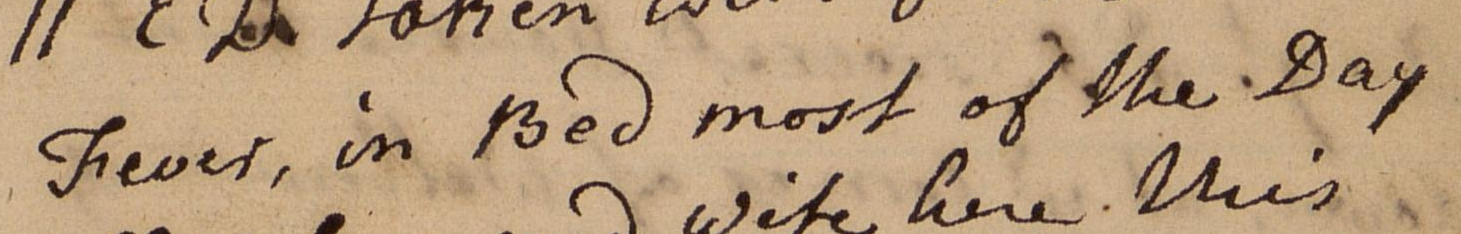Fever, in Bed most of the Day
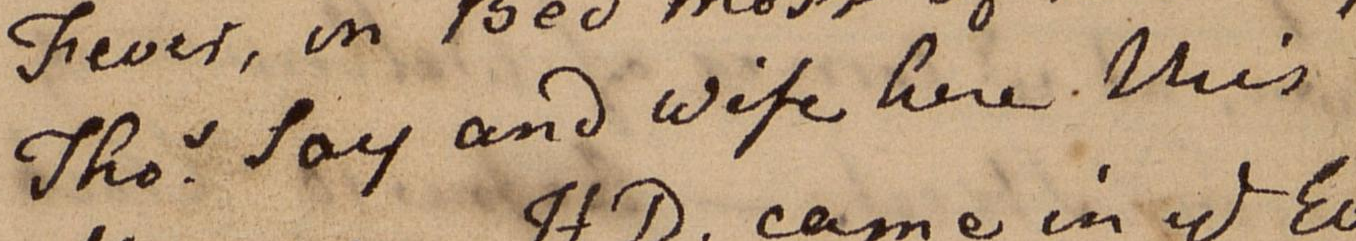Tho^s. Say and Wife here this
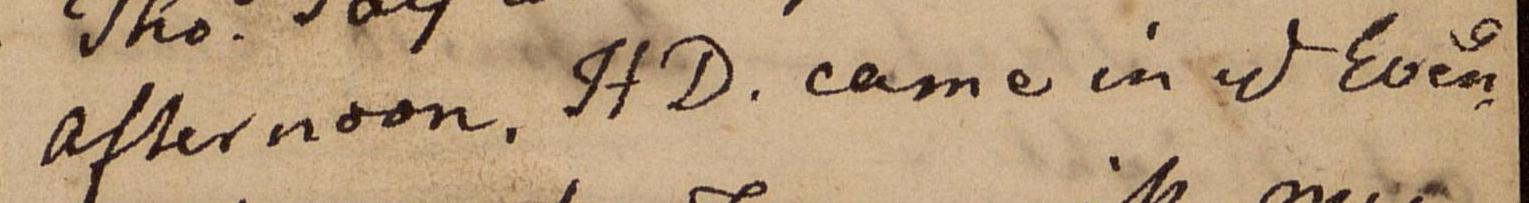Afternoon. HD. came in y^e Even^g
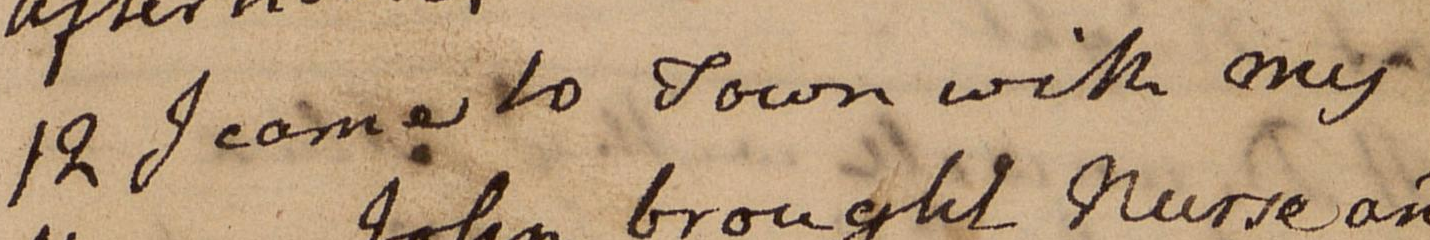12 I came to Town with my
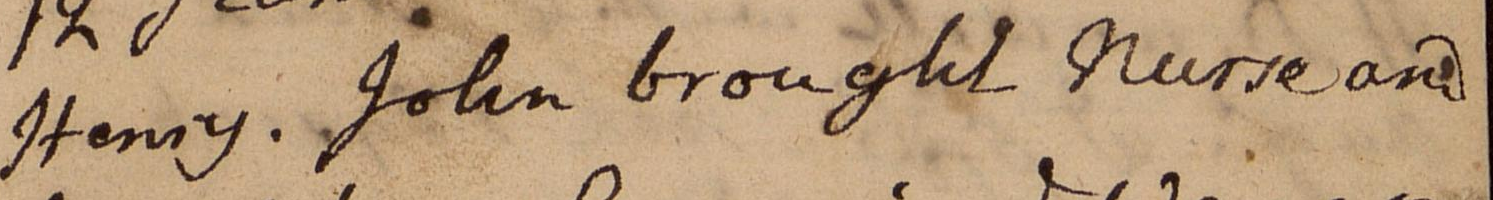Henry. John brought Nurse and
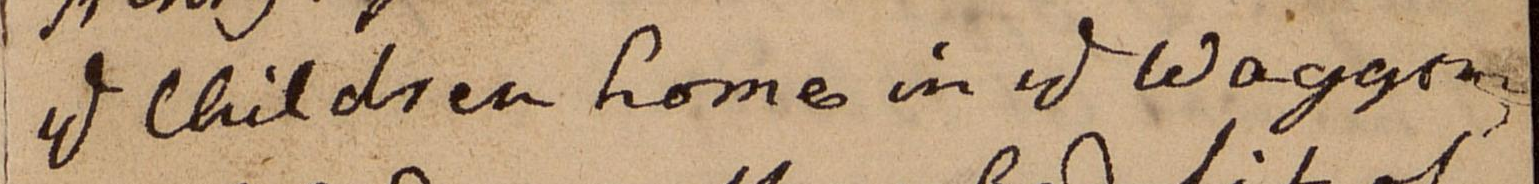y^e Children home in y^e Waggon
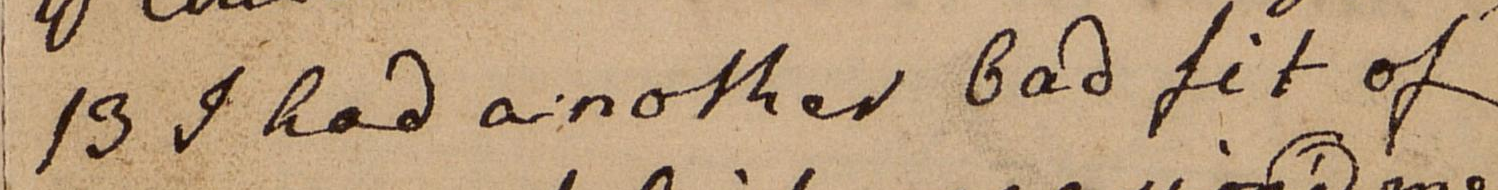13 I had another bad fit of
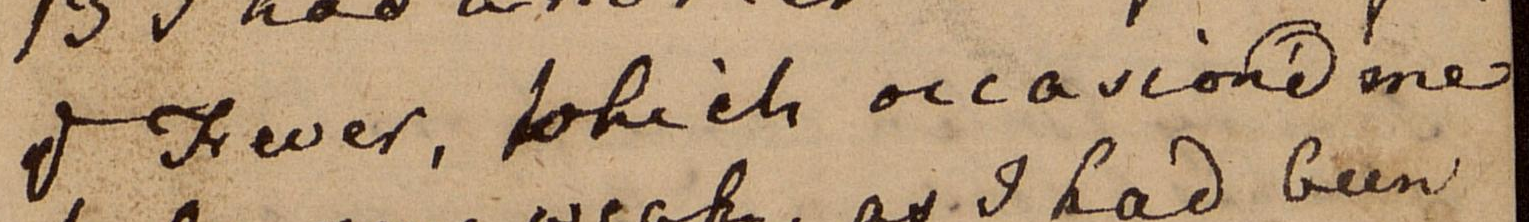y^e Fever, Which occasion'd me
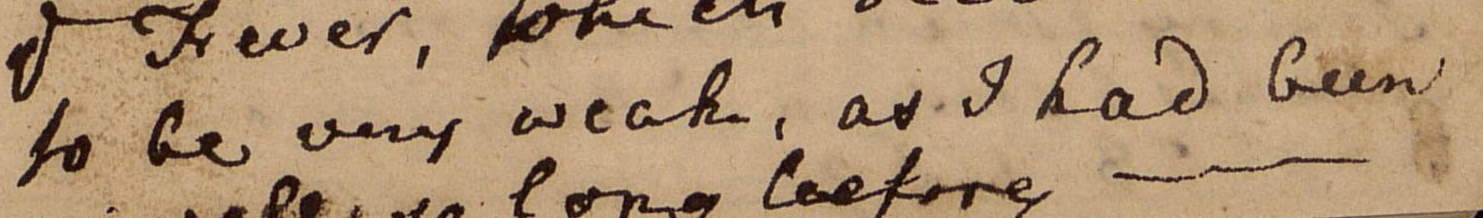to be very weak, as I had been
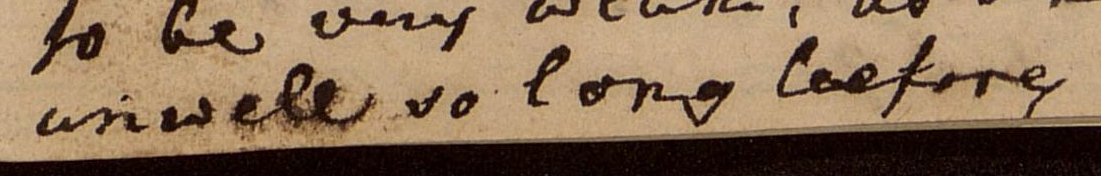unwell so long before,
